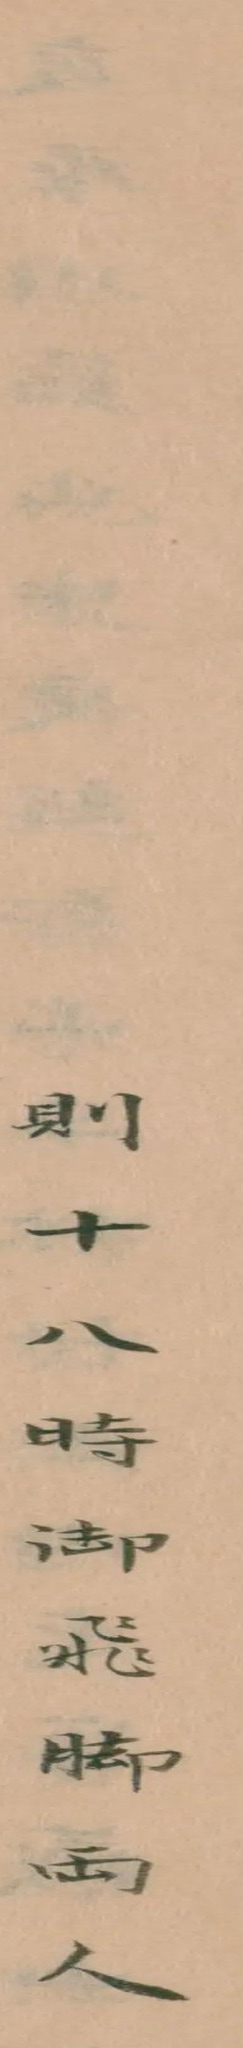則十八時御飛脚両人
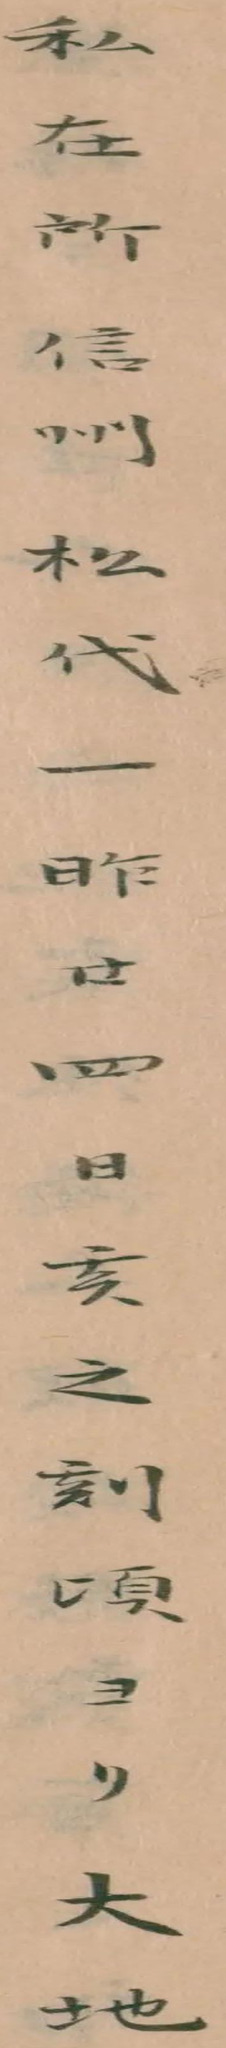私在所信州松代一昨廿四日亥之刻頃ヨリ大地
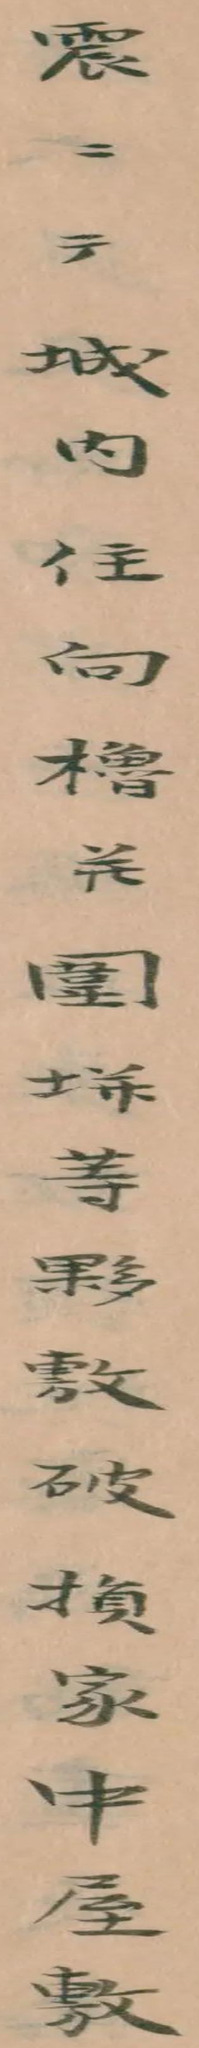震ニテ城内住向櫓并囲塀等夥敷破損家中屋敷
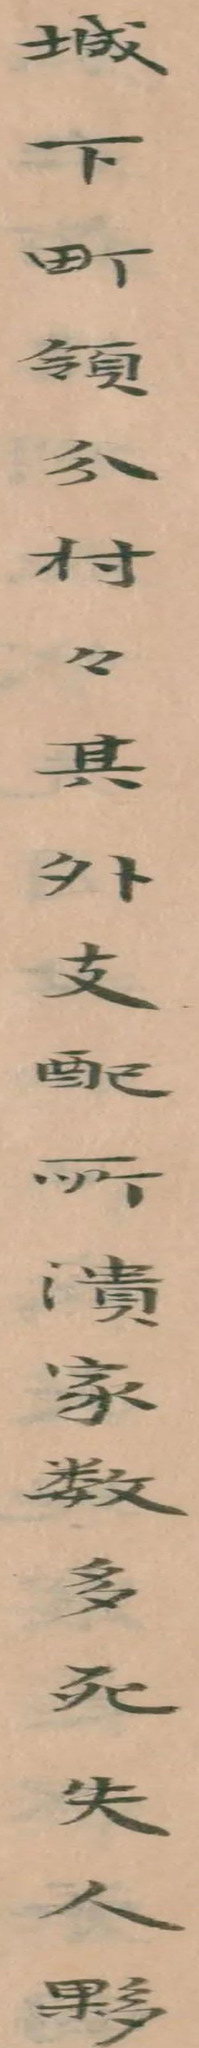城下町領分村々其外支配所潰家数多死失人夥
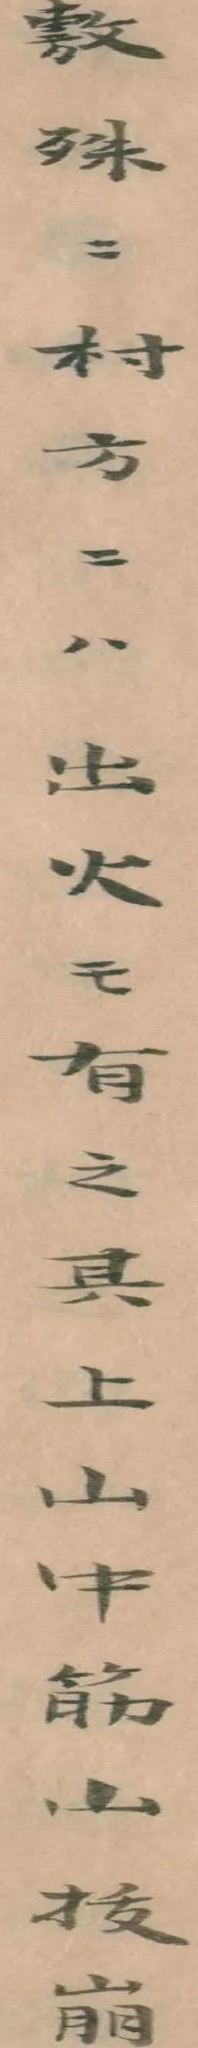敷殊ニ村方ニハ出火モ有之其上山中筋山抜崩
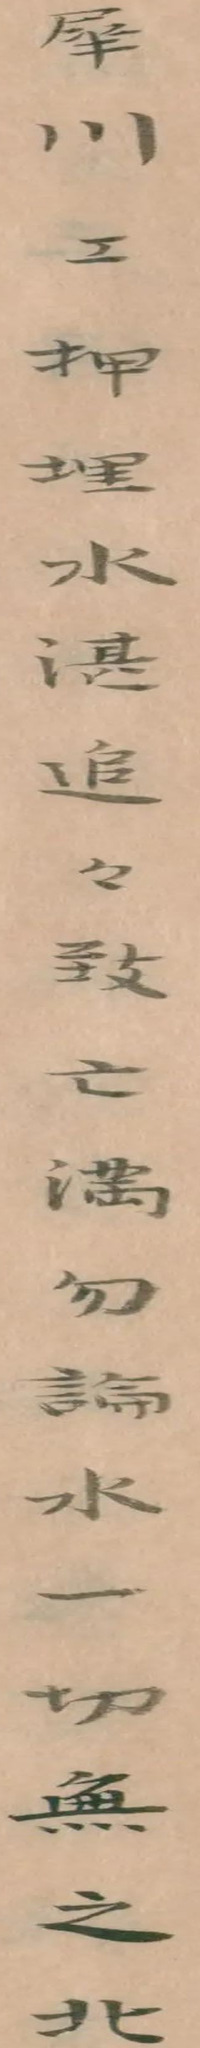犀川エ押埋水湛追々致亡満勿論水一切無之北
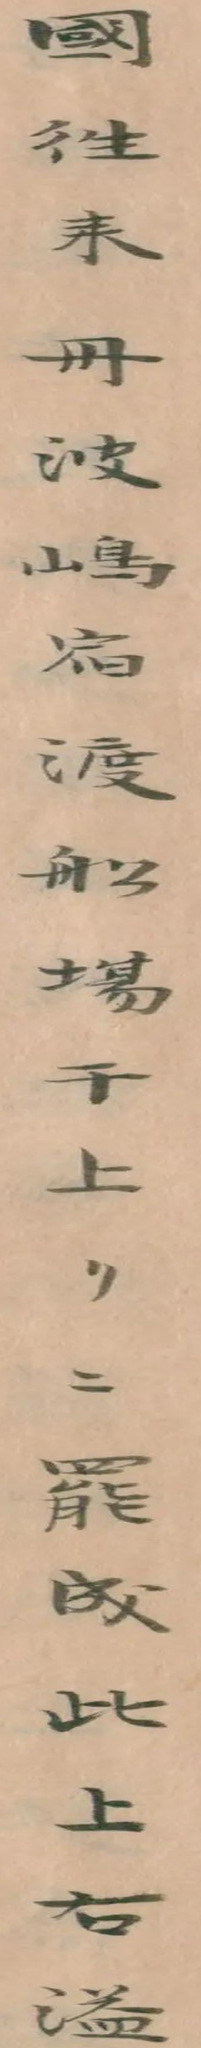国往来丹波嶋宿渡船場干上リニ罷成此上右溢
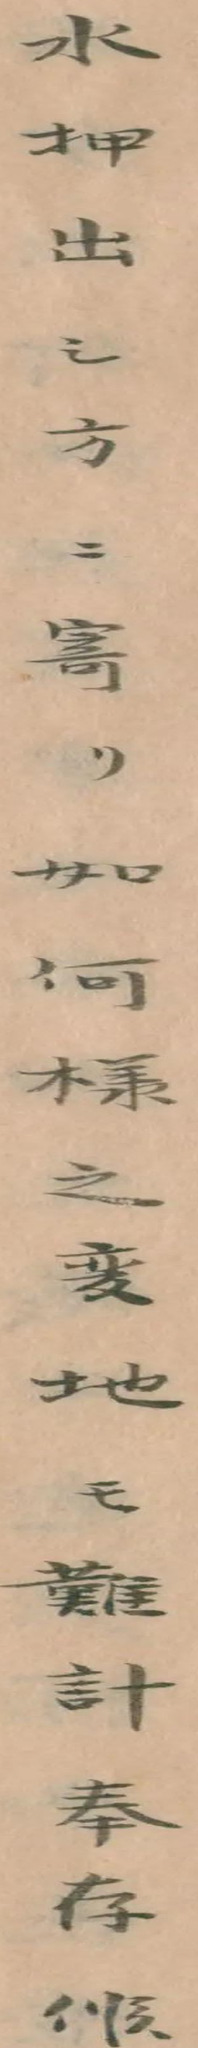水押出シ方ニ寄リ如何様之変地モ難計奉存候

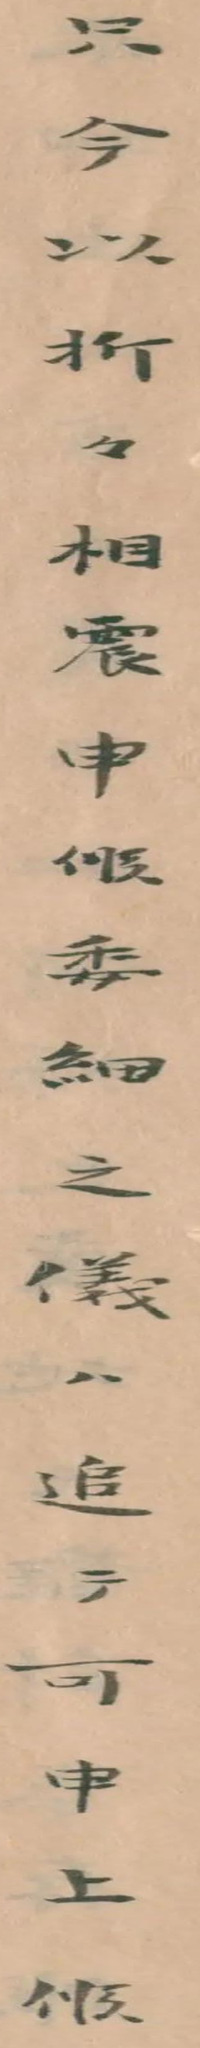只今以折々相震申候委細之儀ハ追テ可申上候
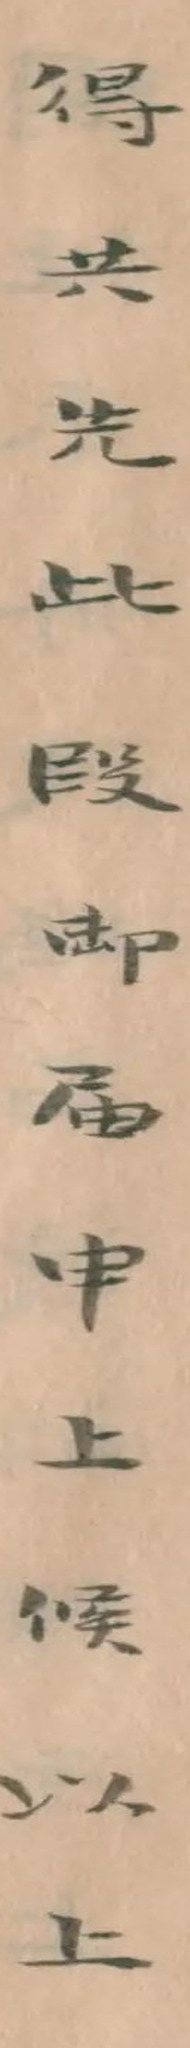得共先此段御届申上候以上
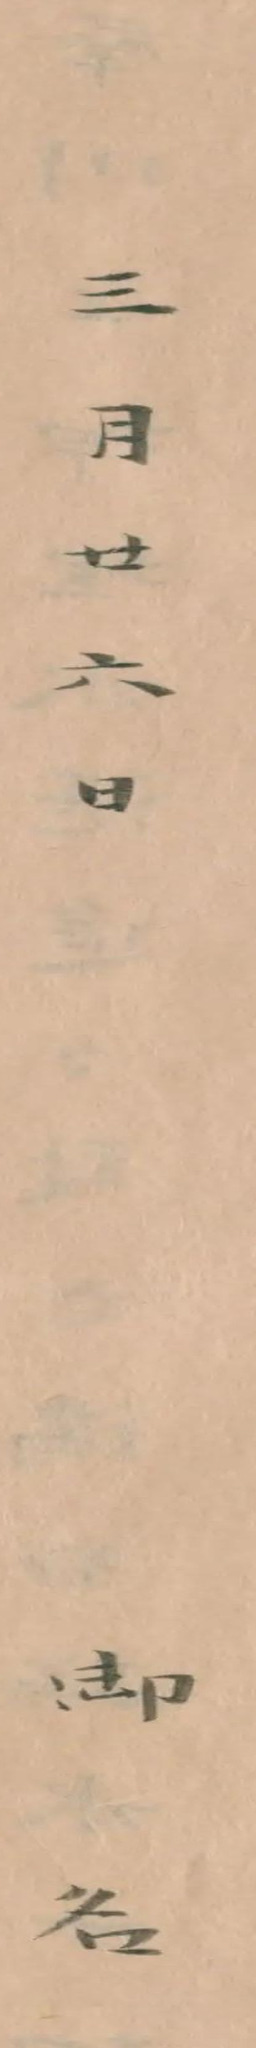三月廿六日御名
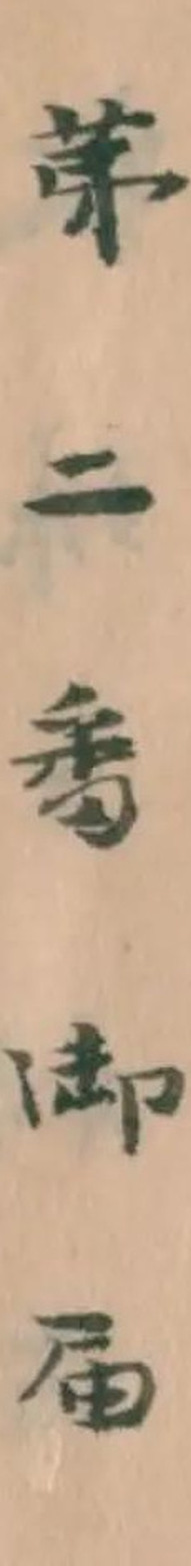第二番御届
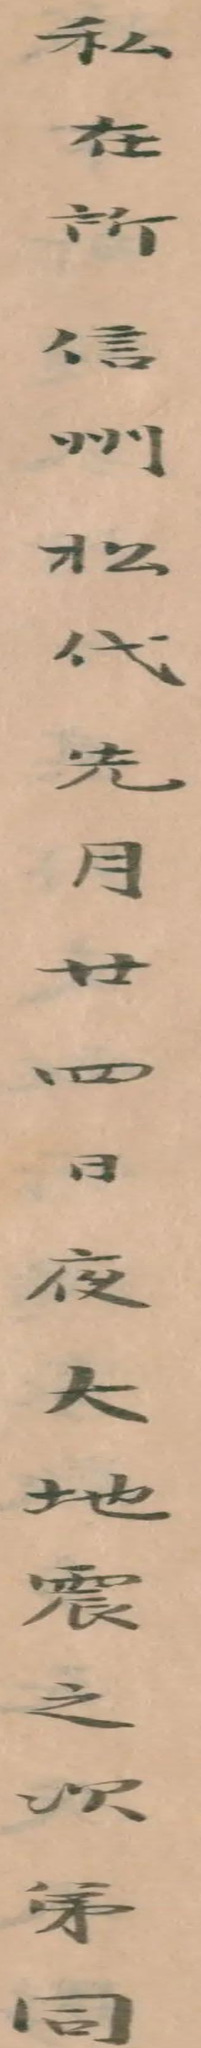私在所信州松代先月廿四日夜大地震之次第同
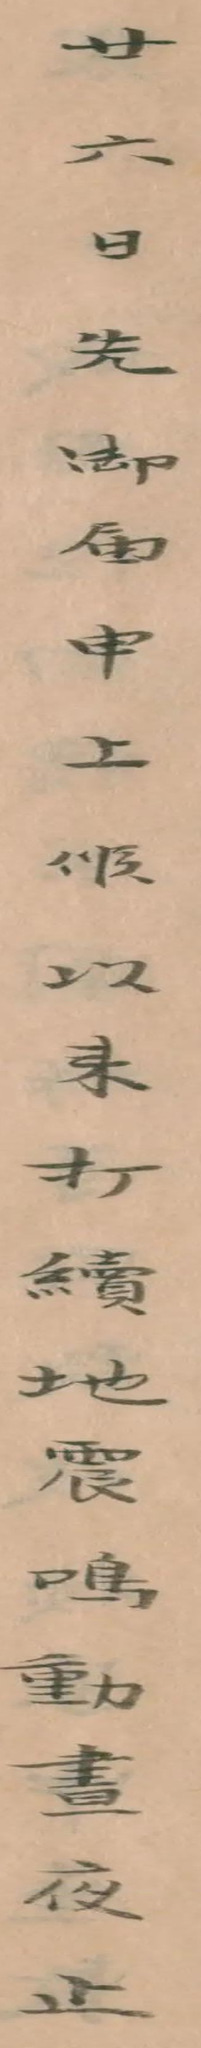廿六日先御届申上候以来打続地震鳴動昼夜止
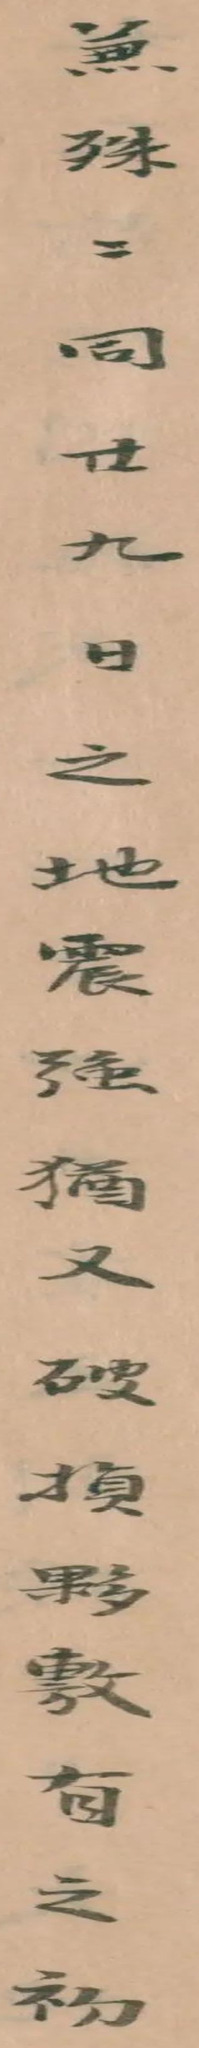兼殊ニ同廿九日之地震強猶又破損夥敷有之初
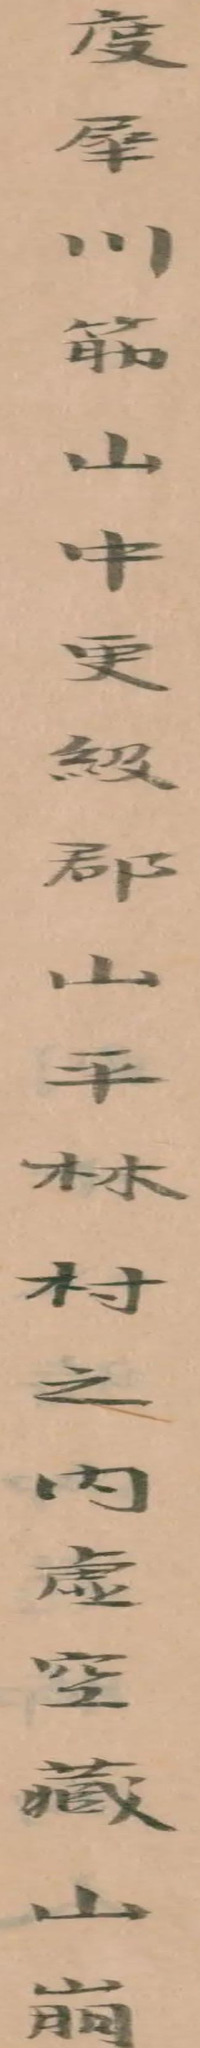度犀川筋山中更級郡山平林村之内虚空蔵山崩
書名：地災撮要. 巻5-6(地震之部)
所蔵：国立国会図書館 National Diet Library, JAPAN
